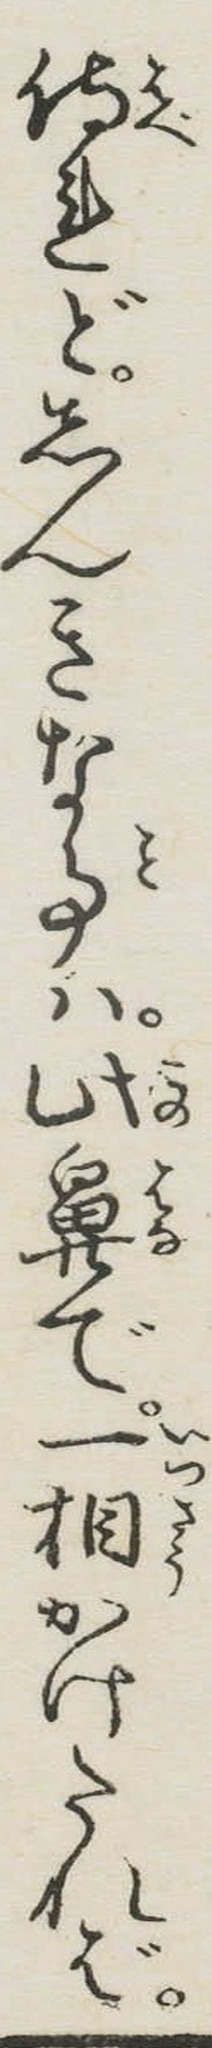侍れど。しんきな事は。此鼻で。一相かけたれば。
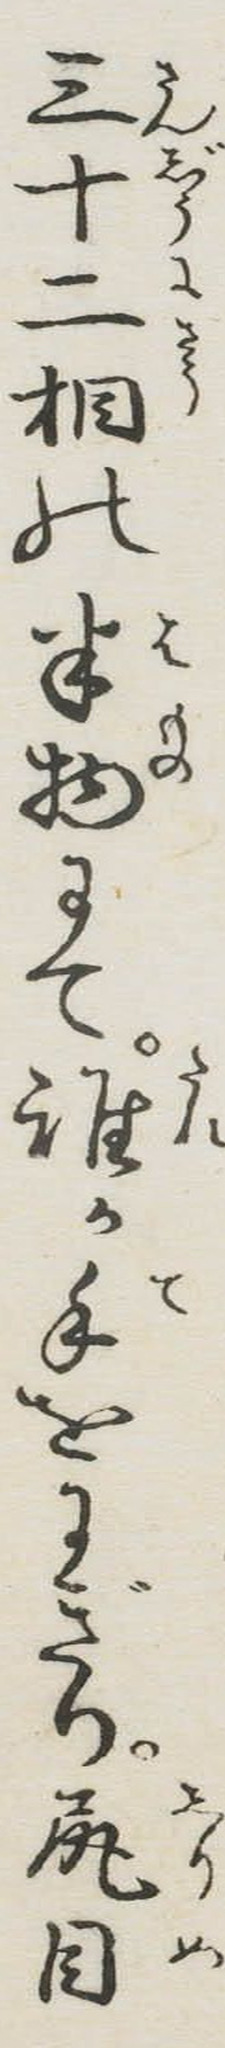三十二相の半物にて。誰か手をにぎり。尻目
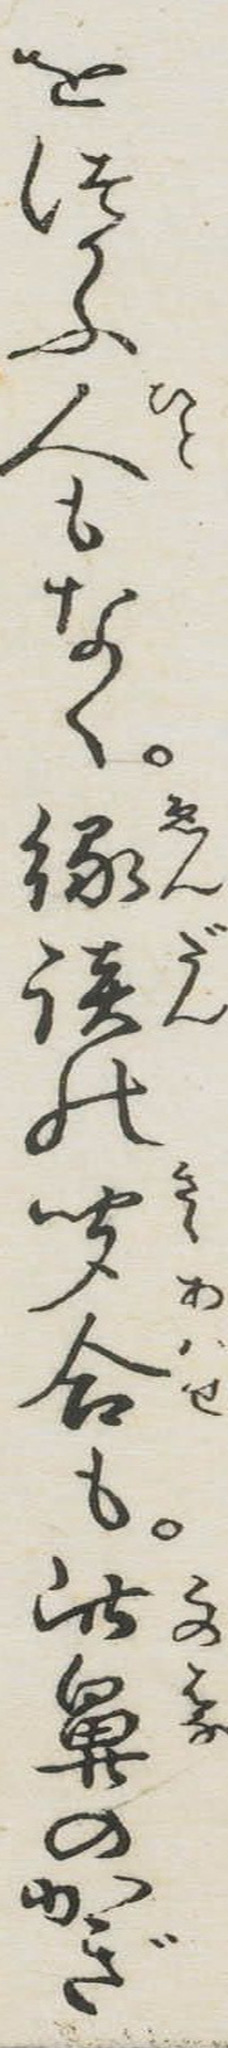をつかふ人もなく。縁談の聞合も。此鼻のかぎ
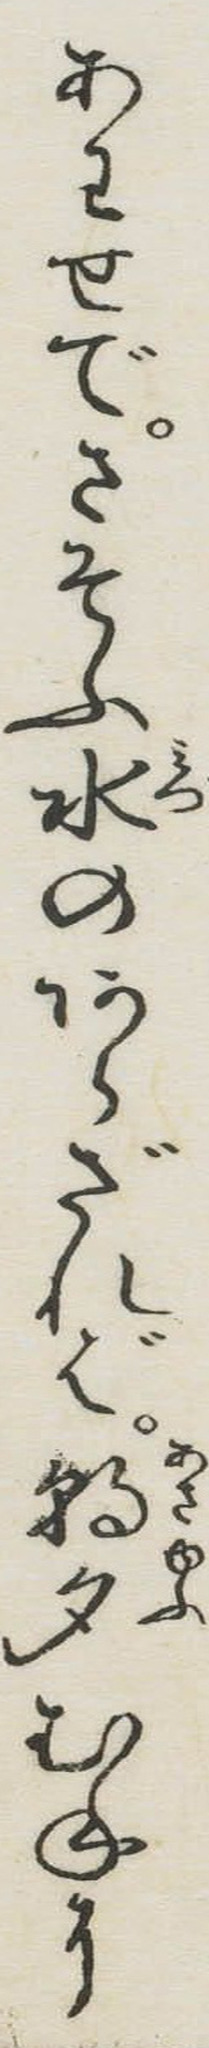あわせで。さそふ水のあらざれば。朝夕むねに
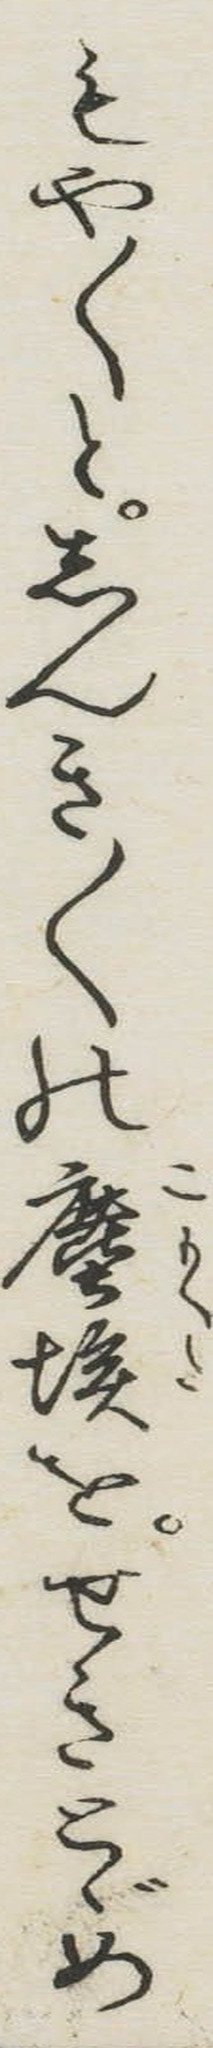もや〳〵と。しんき〳〵の塵埃を。せきとゞめ
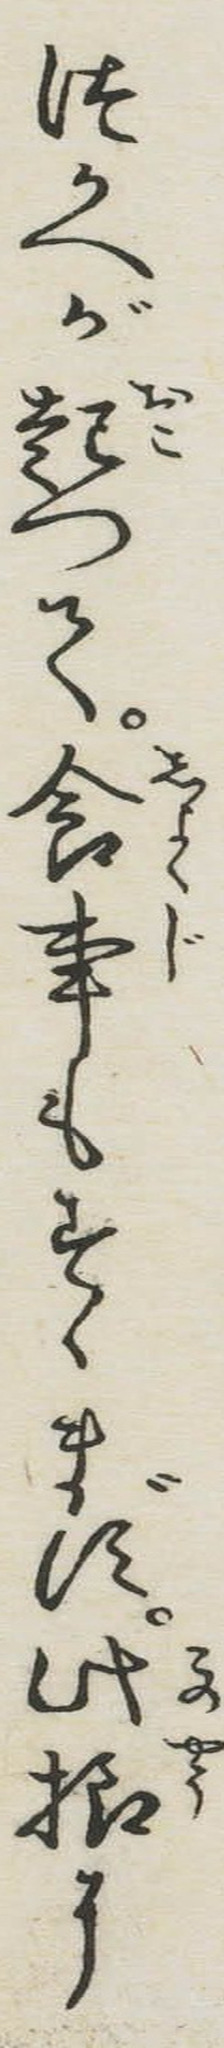つかへが起つて。食事もすゝまず。此様に
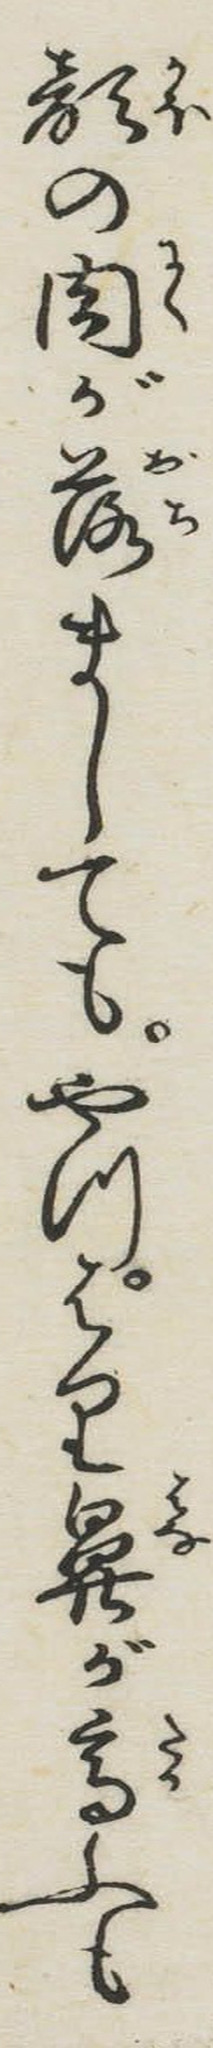顔の肉が落ましても。やつぱり鼻が高ふも
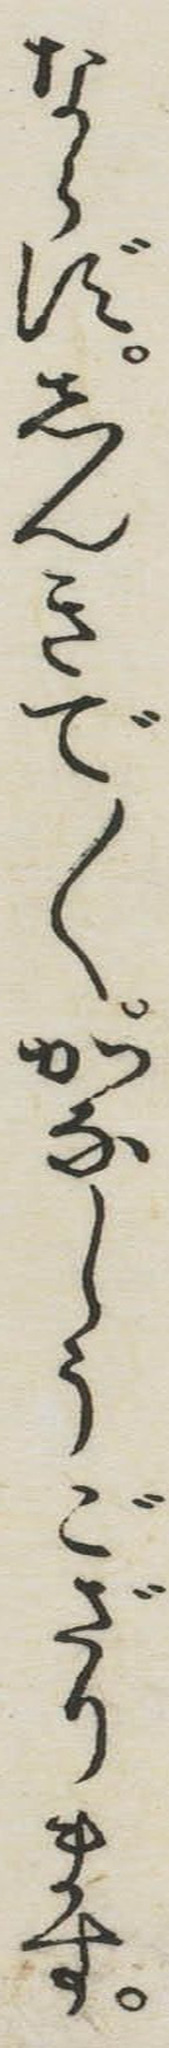ならず。しんきで〳〵。かなしうござります。
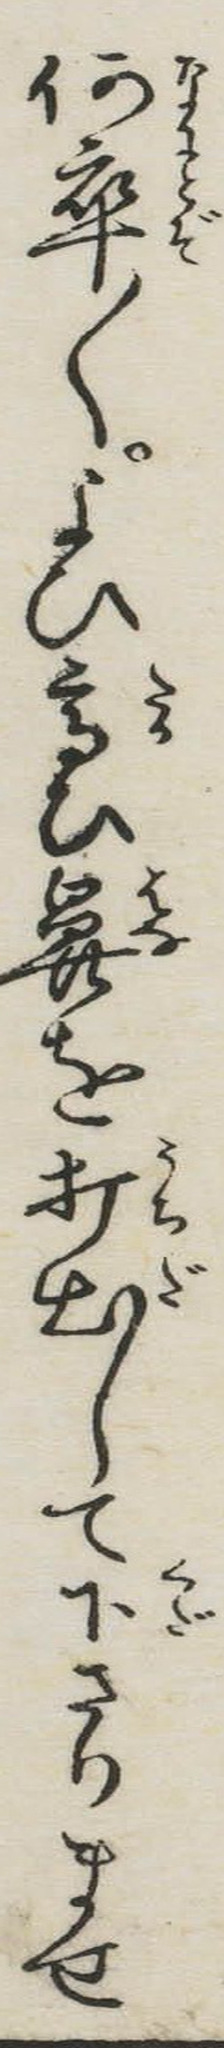何卒〳〵。よひ高ひ鼻を打出して下さりませ

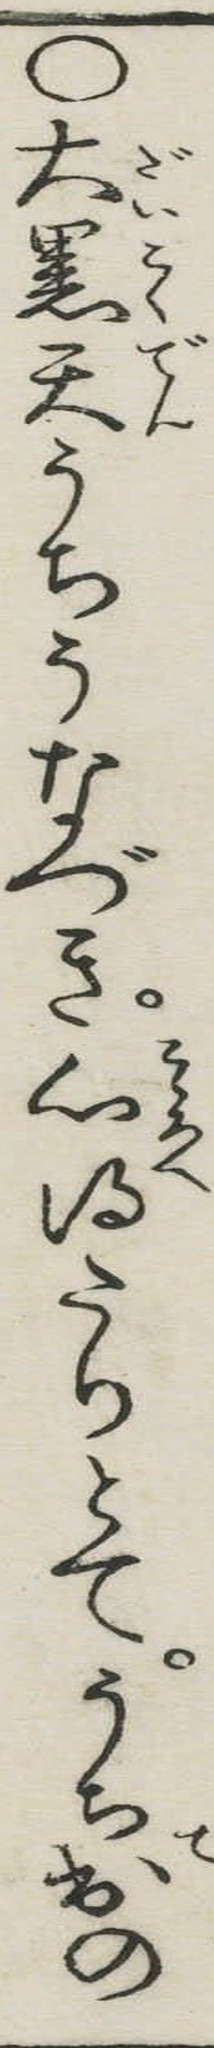○大黒天うちうなづき。心得たりとて。うち出の
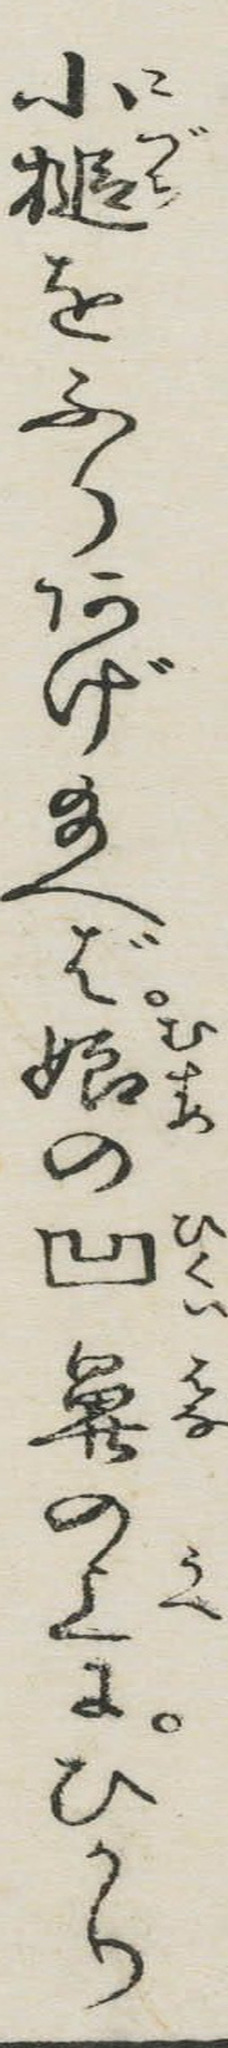小槌をふりあげ給へば。娘の凹鼻の上に。ひかり
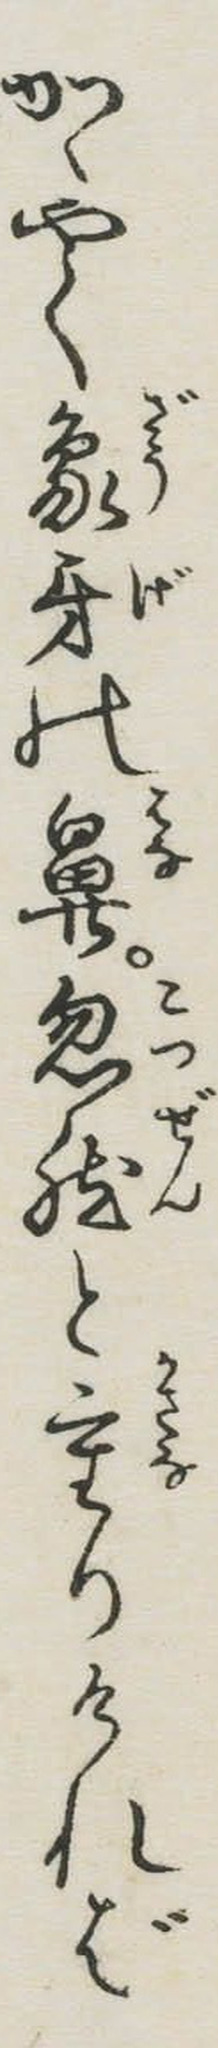かゝやく象牙の鼻。忽然と重りければ
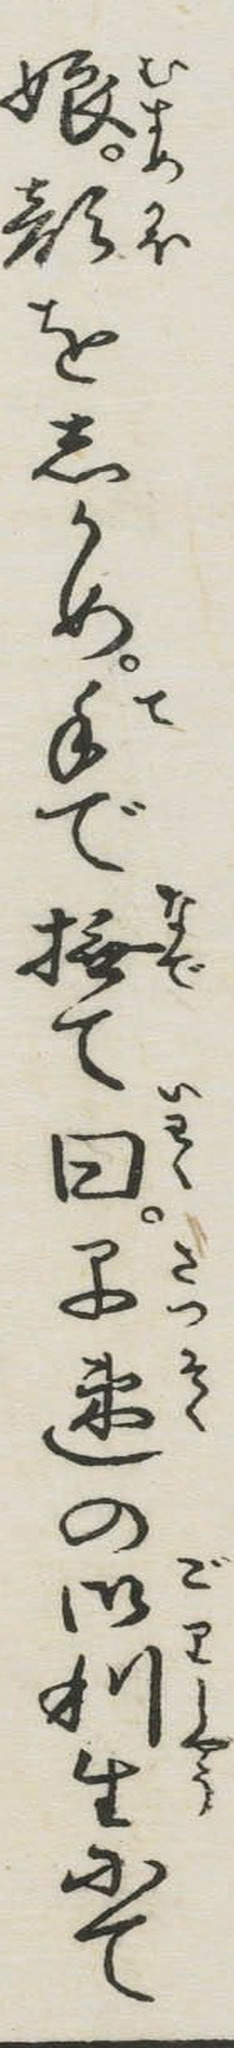娘。顔をしかめ。手で撫て曰。早速の御利生にて
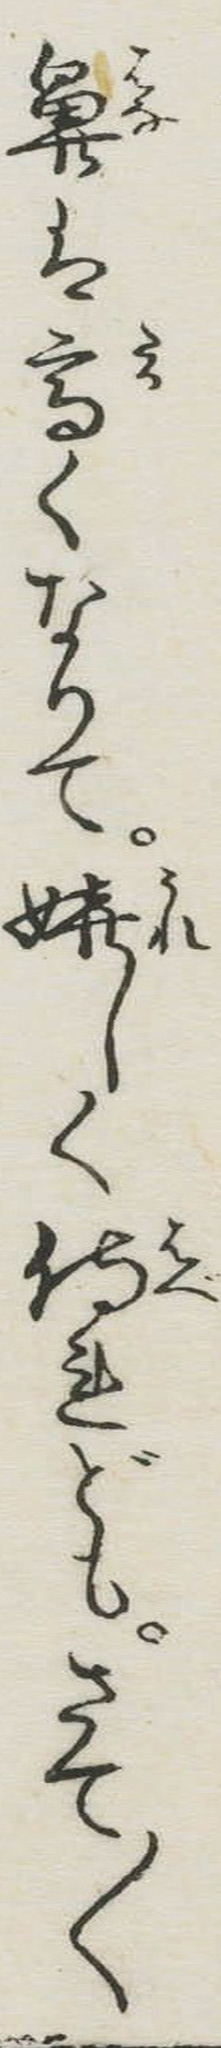鼻は高くなりて。嬉しく侍れども。さて〳〵
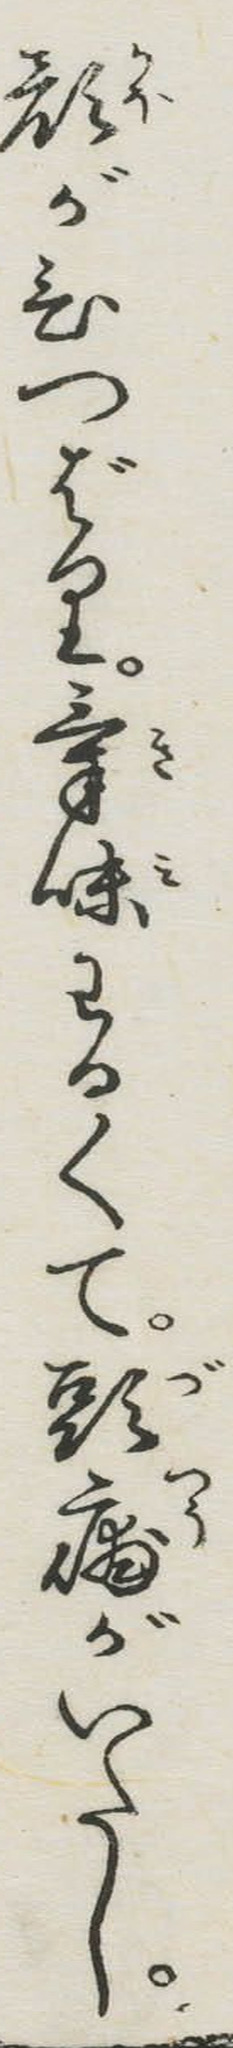顔がひつばり。気味わるくて。頭痛がいたし。
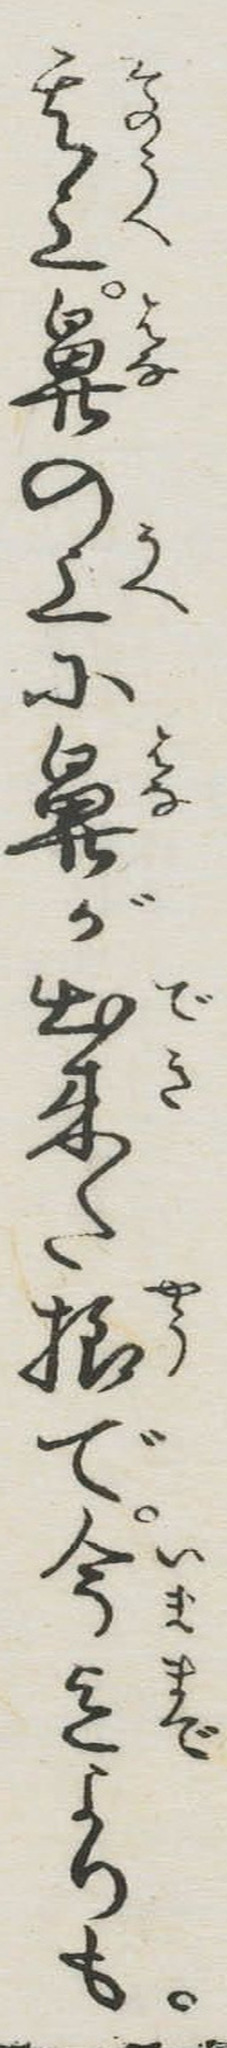其上。鼻の上に鼻が出来た様で。今迄よりも。
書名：福神おしへの小槌 2巻 上
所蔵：東京学芸大学教育コンテンツアーカイブ
